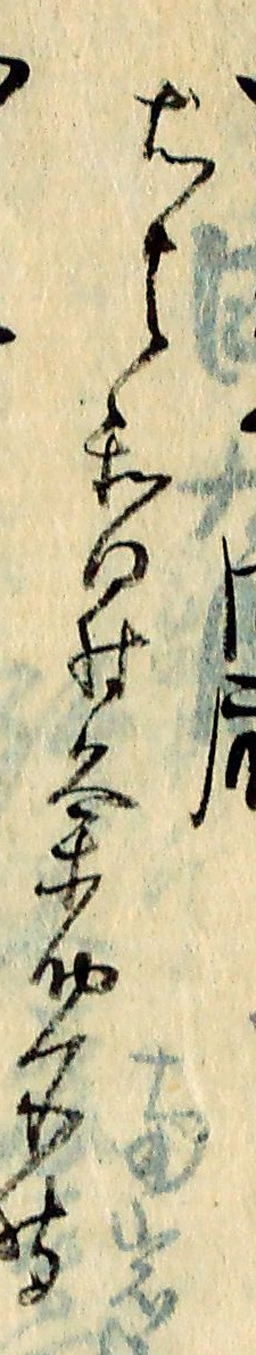右は和田村久米助所持
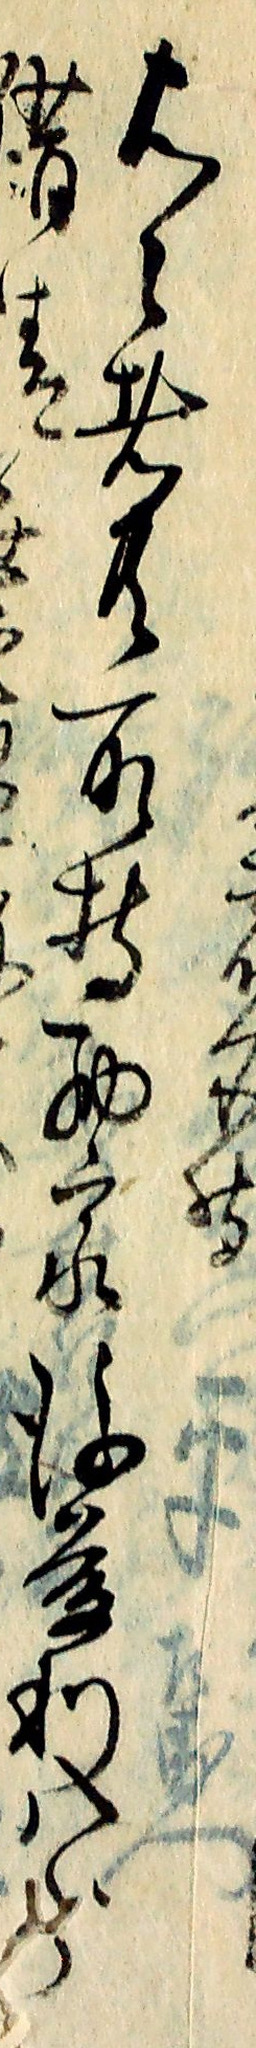右之者共所持西家後藤利八郎
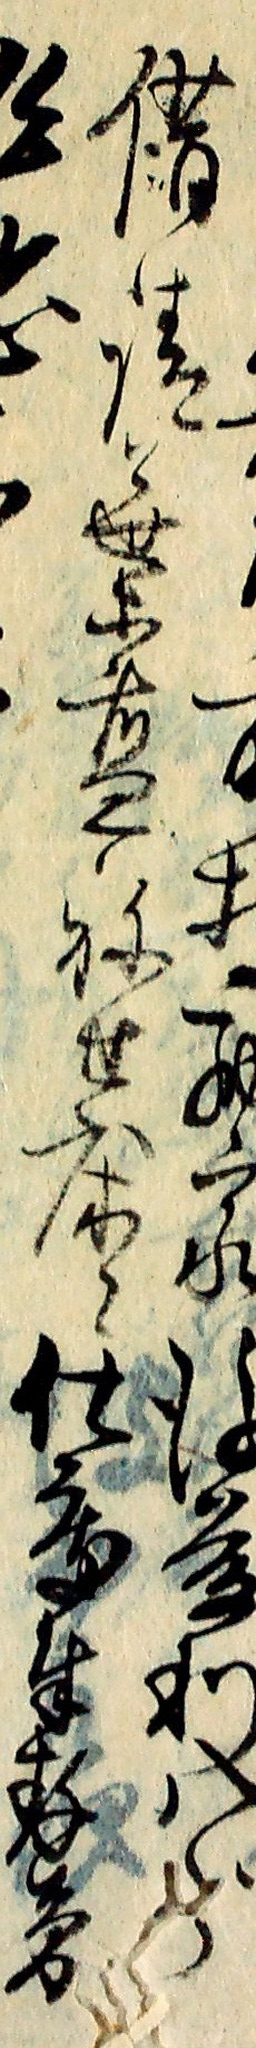借請葉藍ねせ床に仕度奉存候間
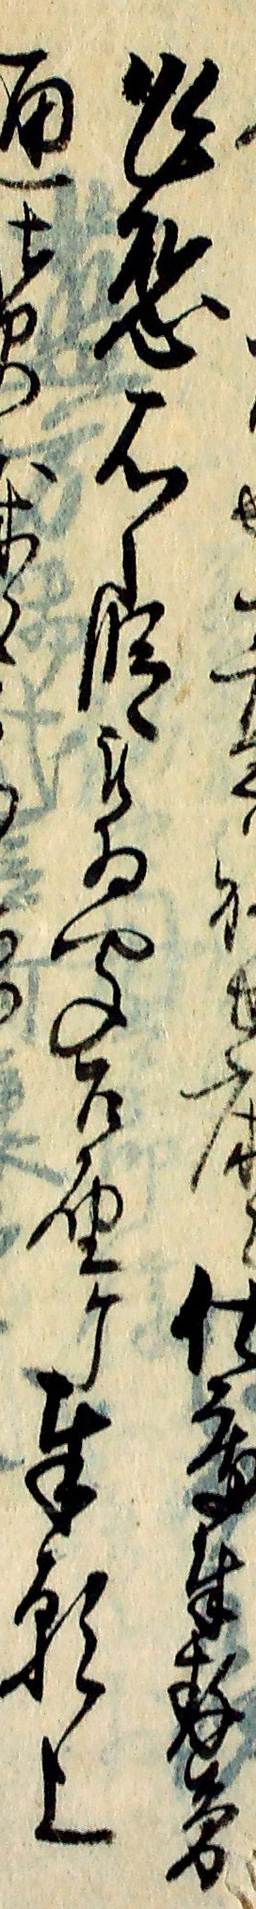乍恐右之段被為聞召届け奉願上
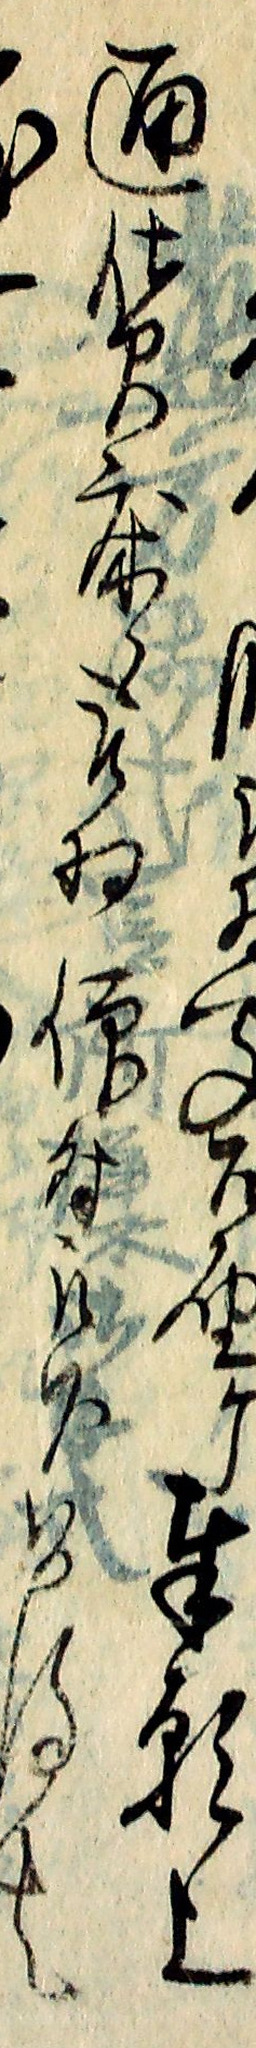通貸床も被為仰付被下候得は
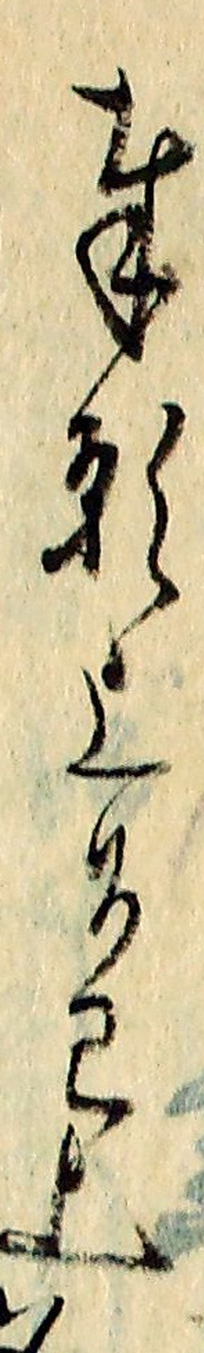奉願上候已上
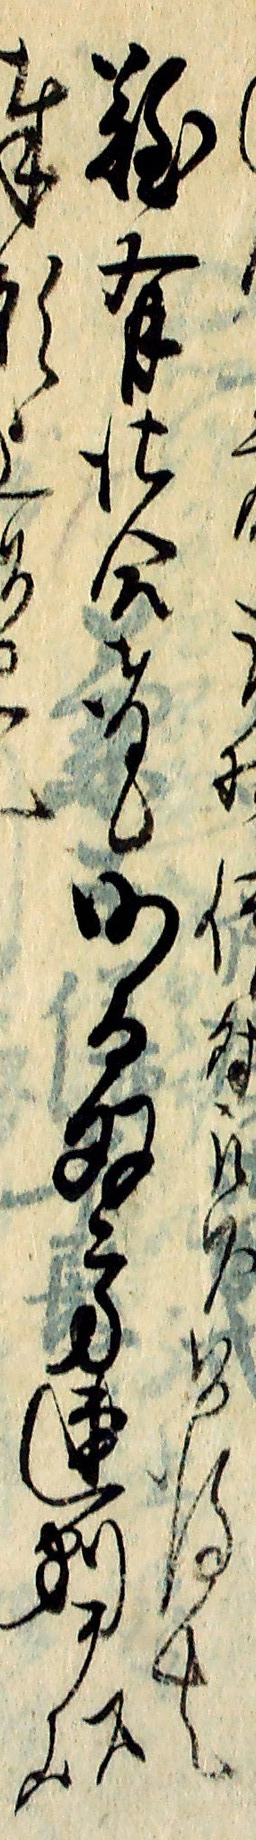難有仕合奉存候仍て双方連判を以
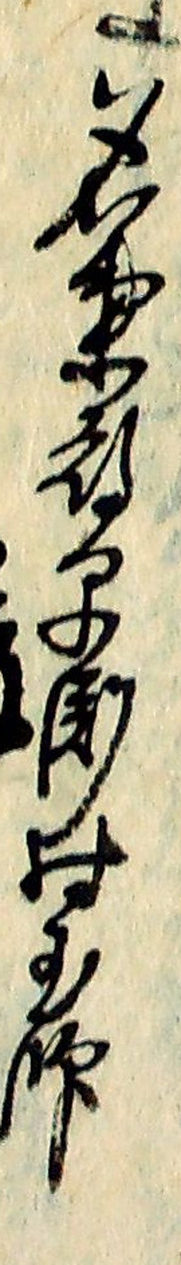名東郡早淵村玉師
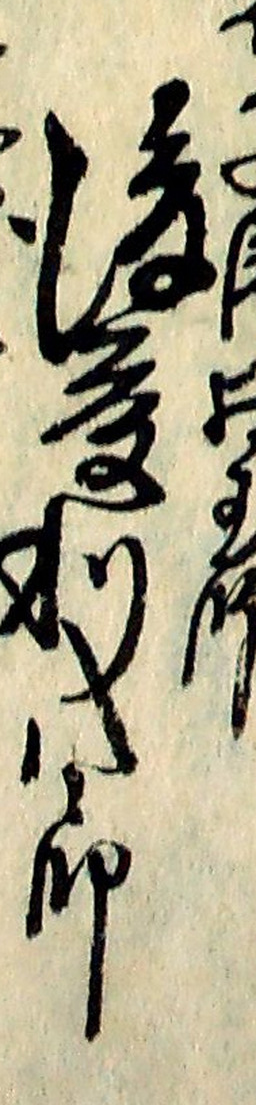後藤利八郎
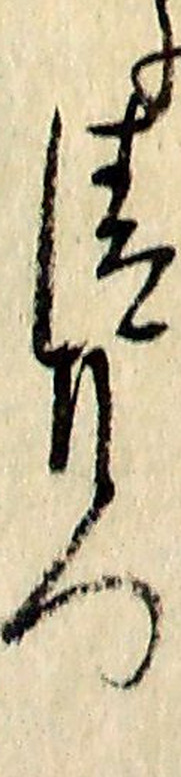清左衛門
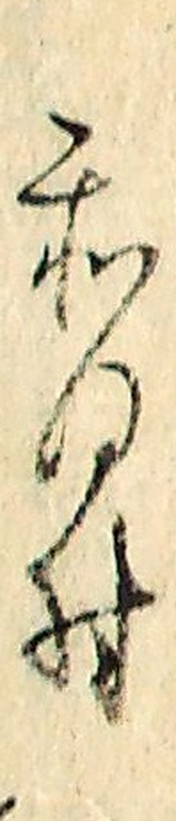和田村
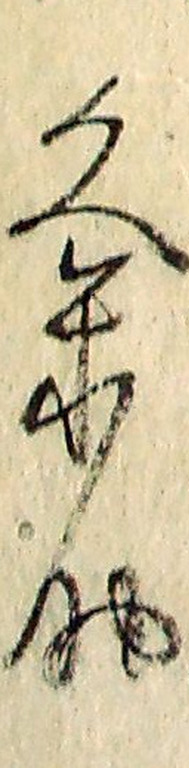久米助

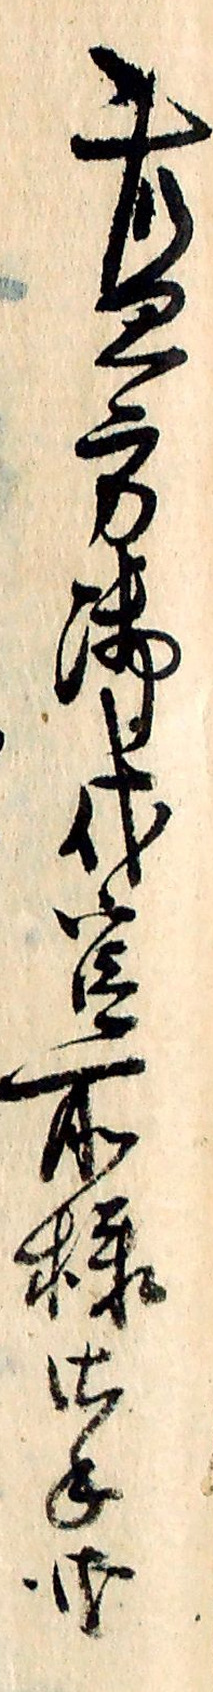藍方御代官所様御手代
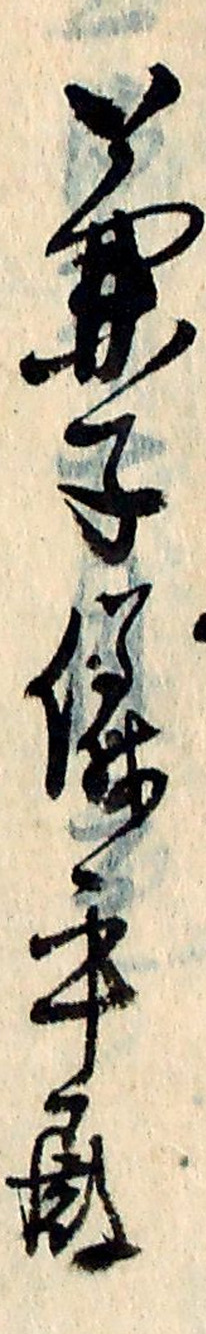兼子儀平殿
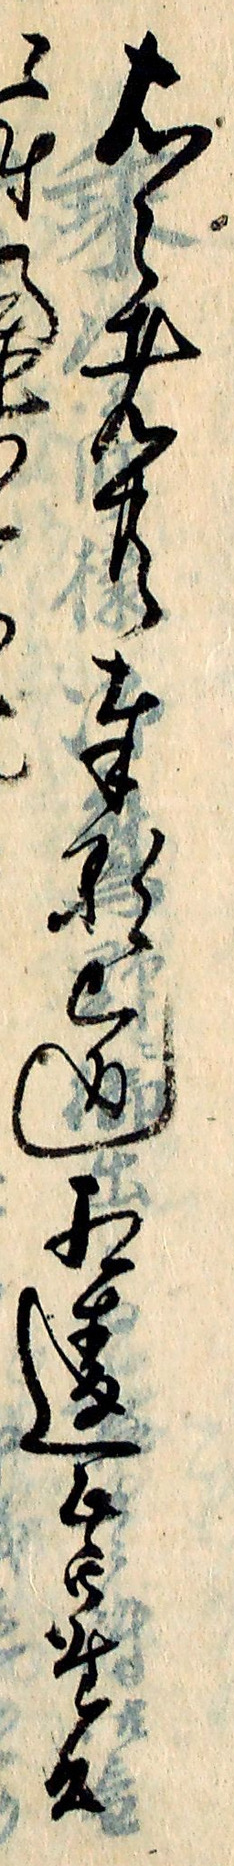右之者共奉願上通相違無御座候
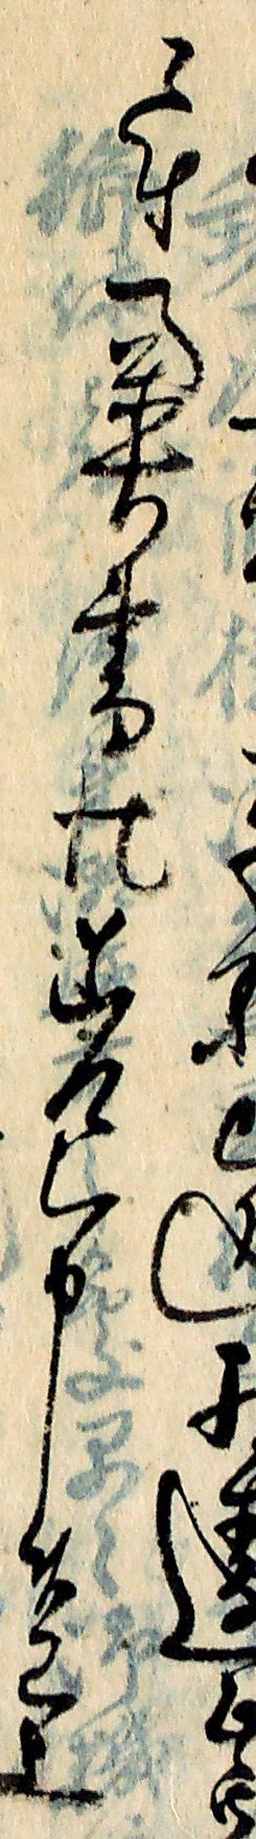に付奥書仕差上申候已上
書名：諸御願書控(後藤氏壱番）
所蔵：鳴門教育大学 Naruto University of Education
